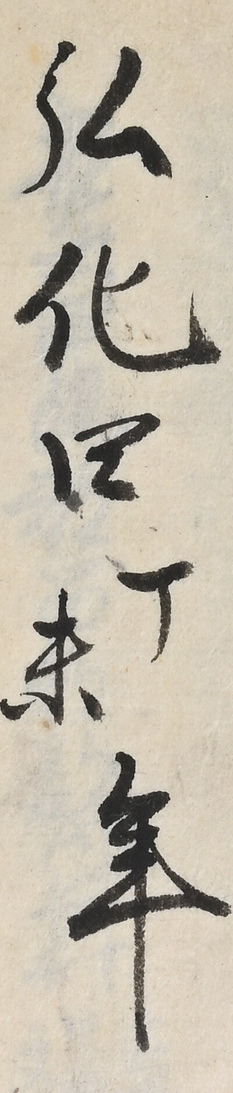弘化四丁未年
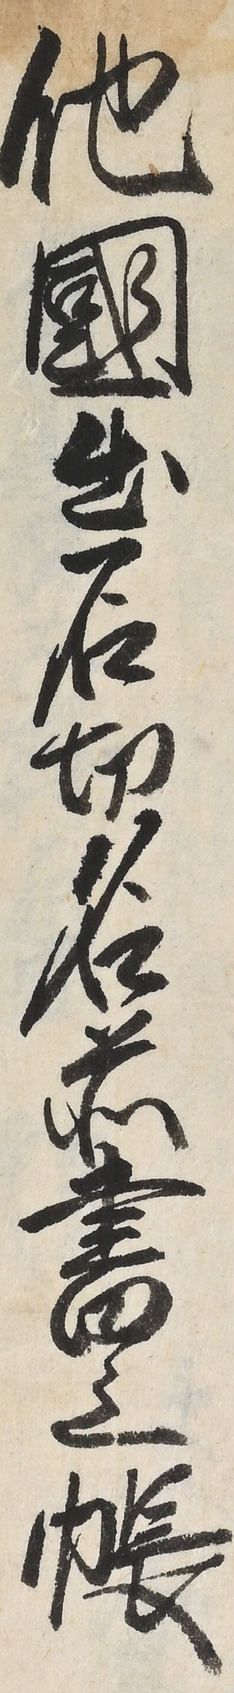他国出石切名前書上帳

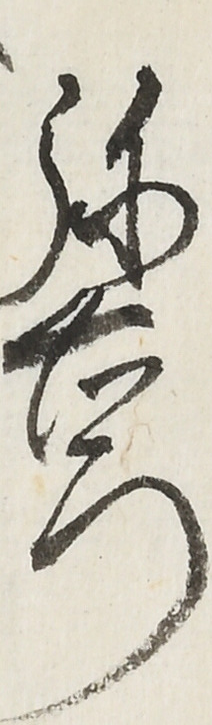弥右衛門
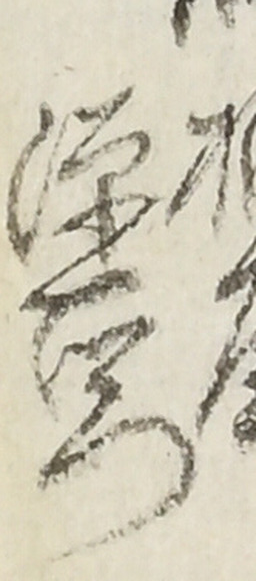弥右衛門

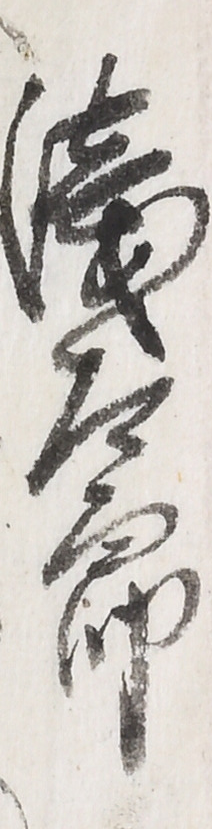浅太郎
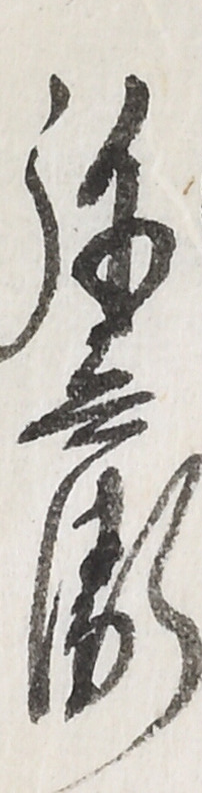万兵衛
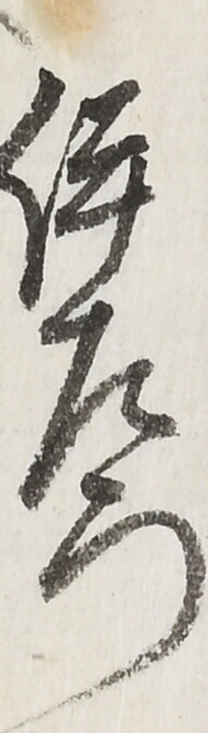伊左衛門
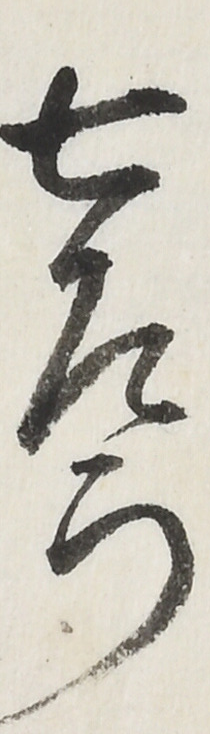七左衛門

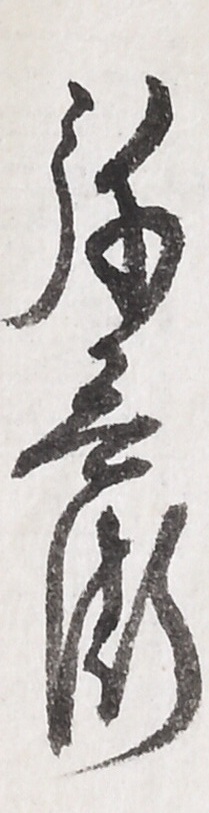与兵衛
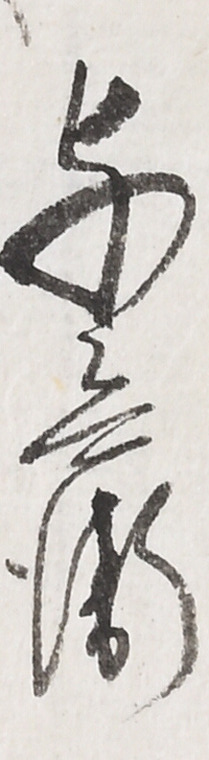与兵衛
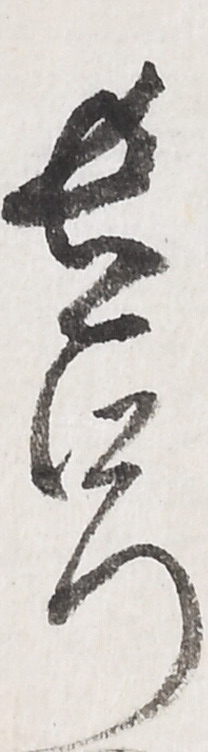作右衛門
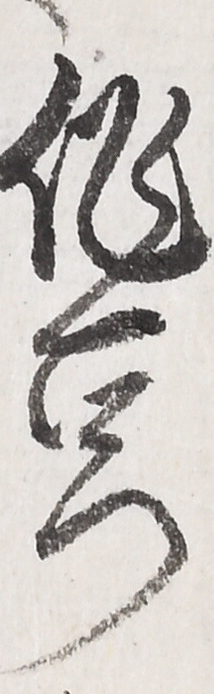作右衛門
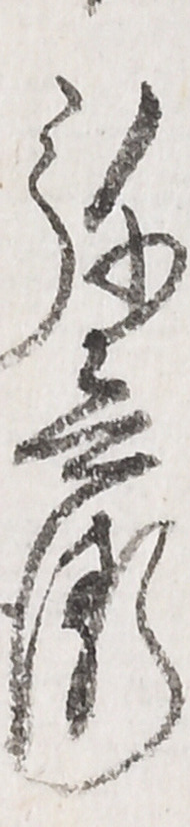与兵衛
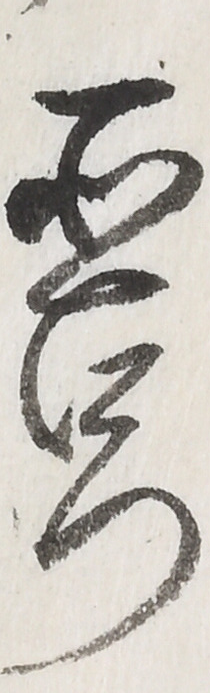所右衛門
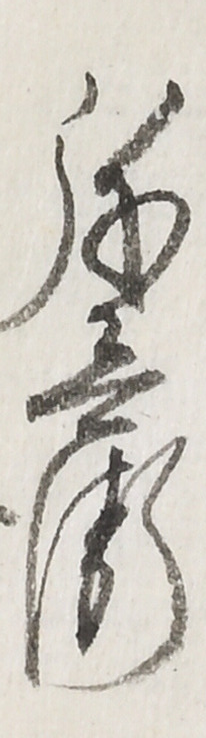与兵衛
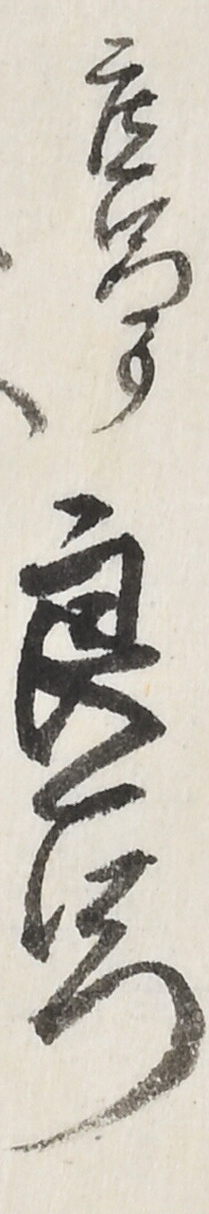作右衛門
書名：弘化四丁未年正月他國出石切名前書上帳
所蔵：伊那市立高遠町図書館・合同会社AMANE
